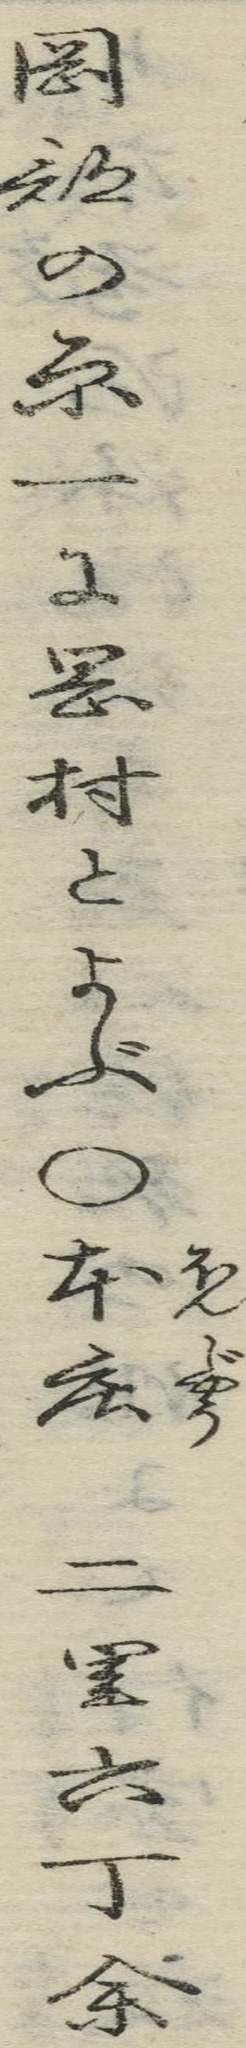岡部の原一に岡村とよぶ○本庄二里六丁余
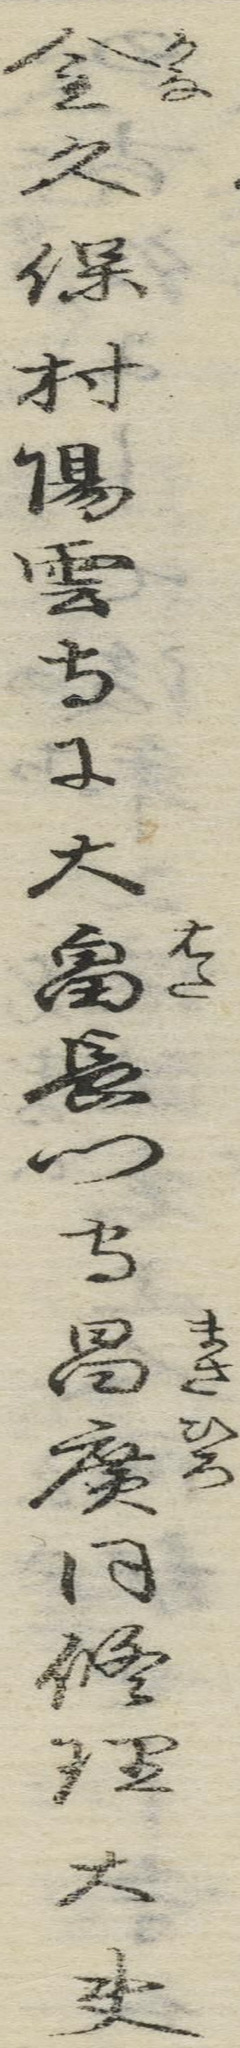金久保村陽雲寺に大畠長門守昌廣同修理大夫
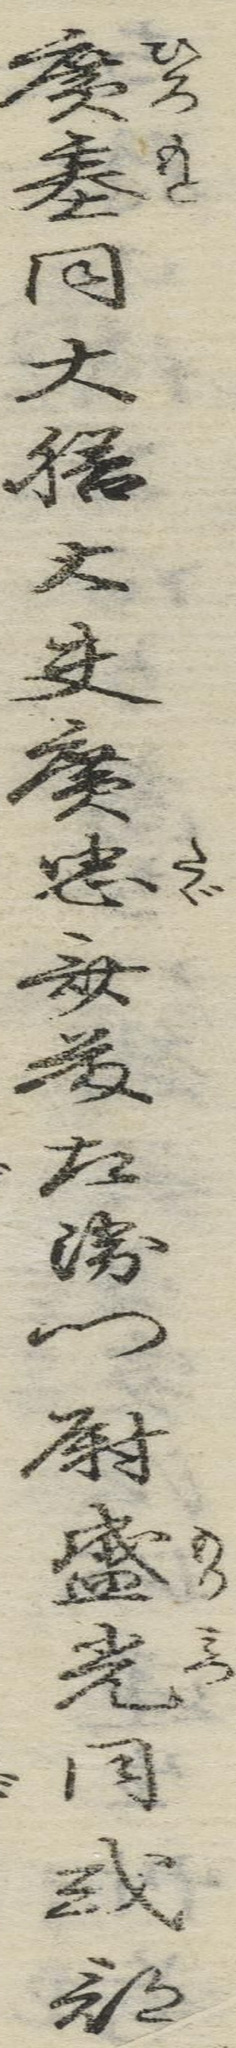廣基同大膳大夫廣忠斎藤左衛門尉盛光同式部
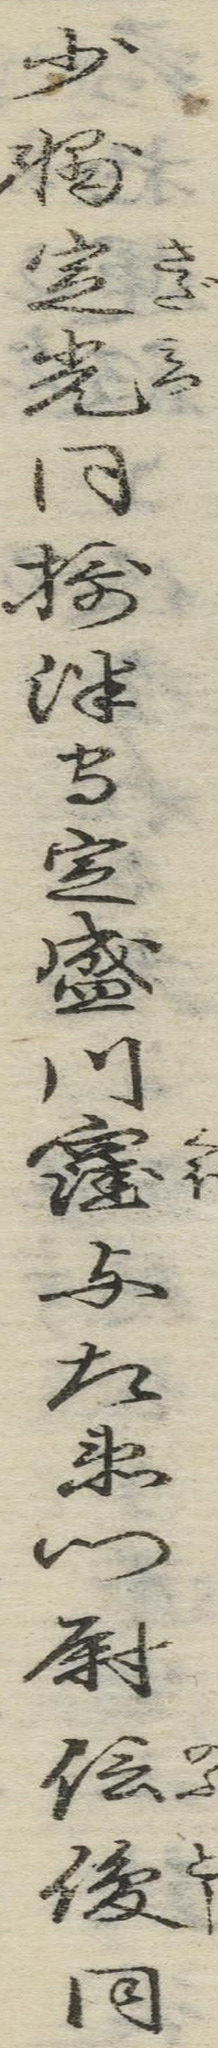少輔定光同摂津守盛川窪与左衛門尉信俊同
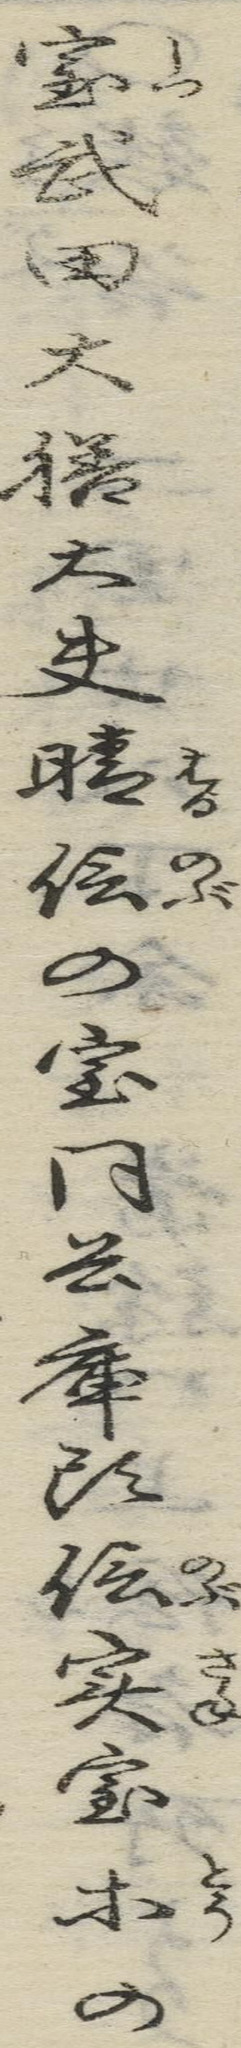室武田大膳大夫晴信の室同兵庫頭信実室等の
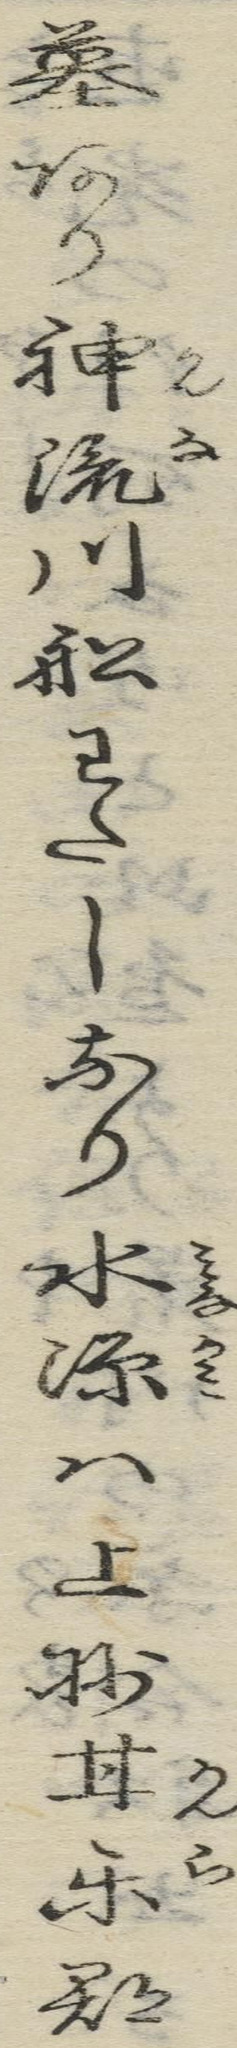墓あり神流川船わたしなり水源は上州甘楽郡
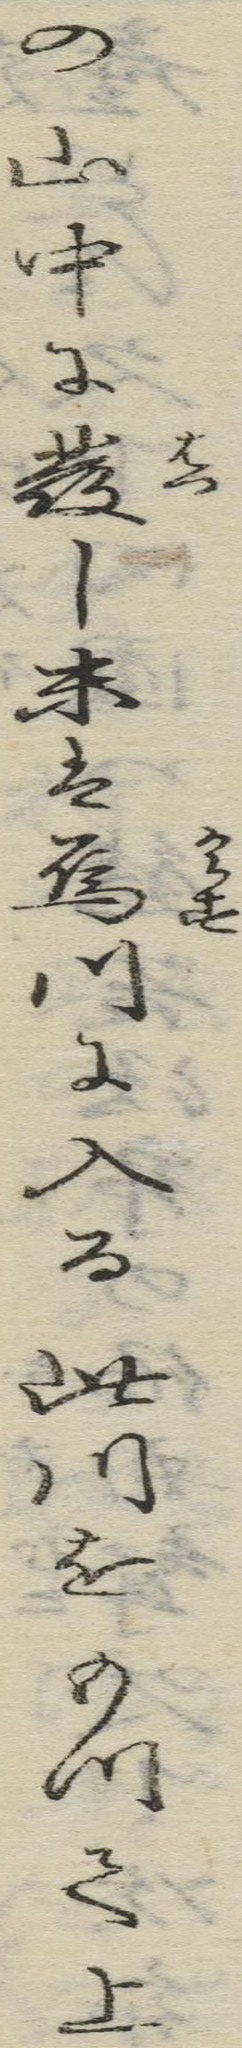の山中に發し末は烏川に入る此川をもつて上
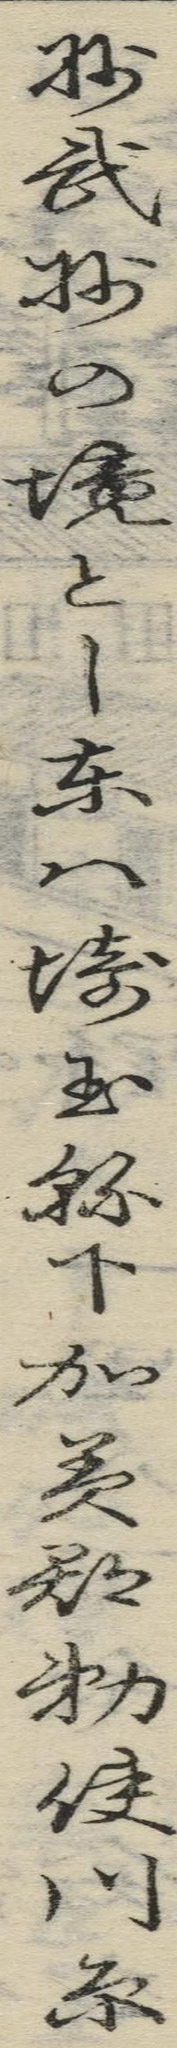州武州の境とし東は埼玉縣下加美郡勅？使川原
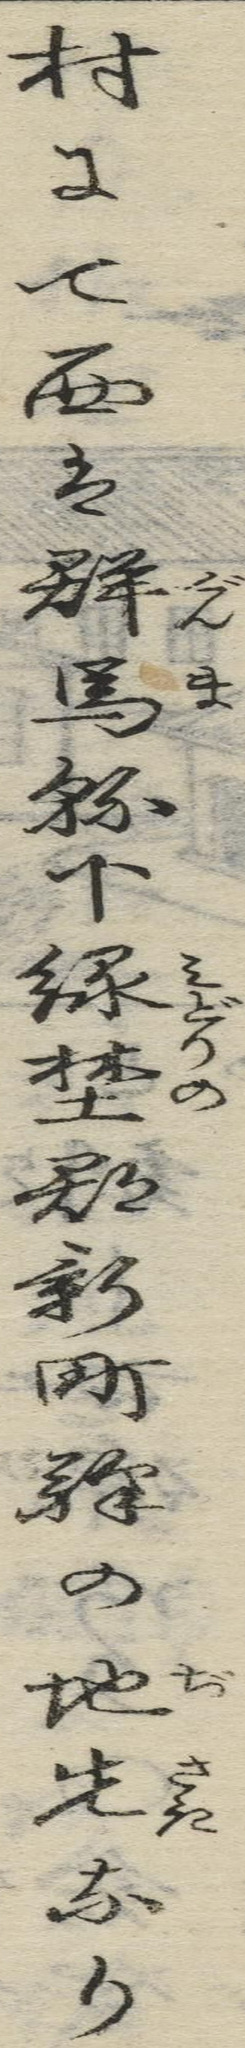村にて西は群馬縣下緑埜郡新町驛の地先なり
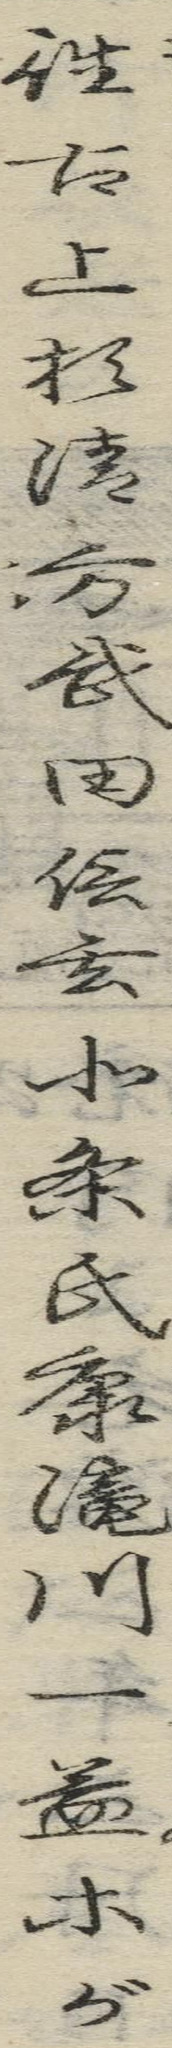往古上杉清方武田信玄北条氏康滝川一益等が
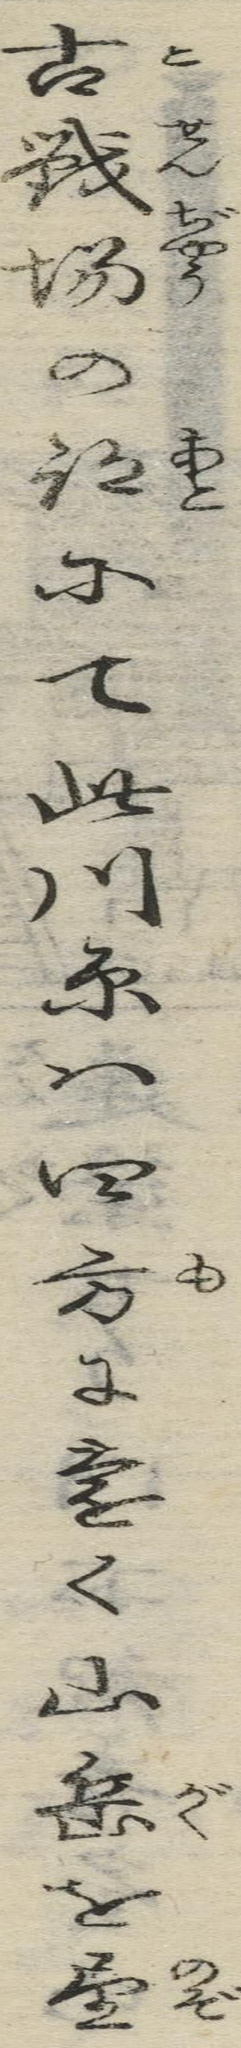古戦場の跡にて此川原は四方に遠く山岳を望
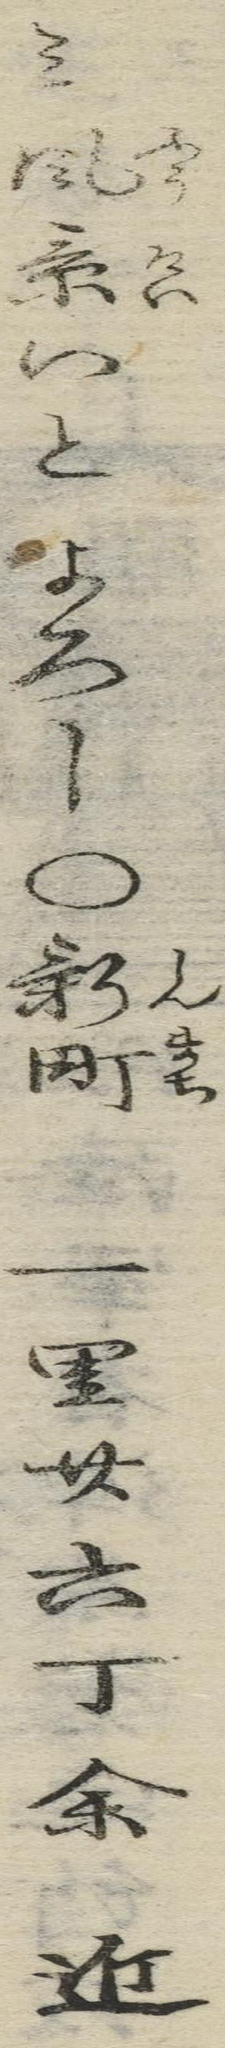み風景いとよろし○新町一里廿六丁余近
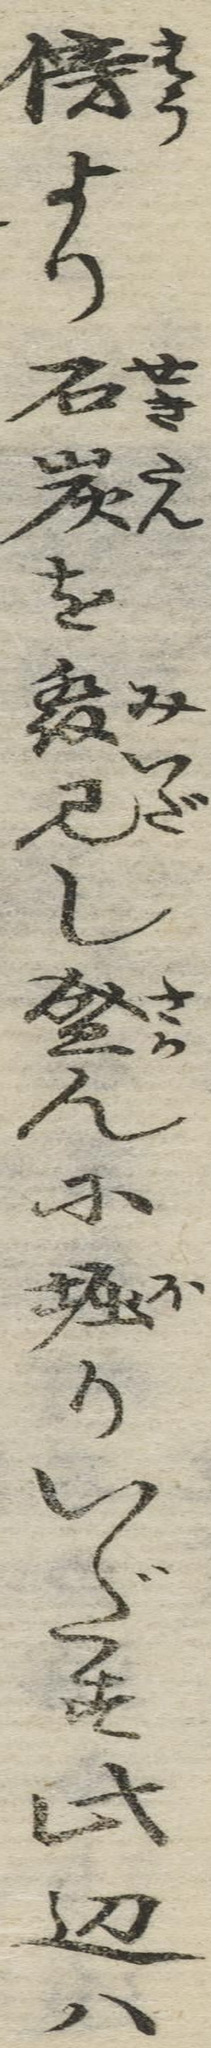傍より石炭を發見し盛んに掘りいだす此辺は
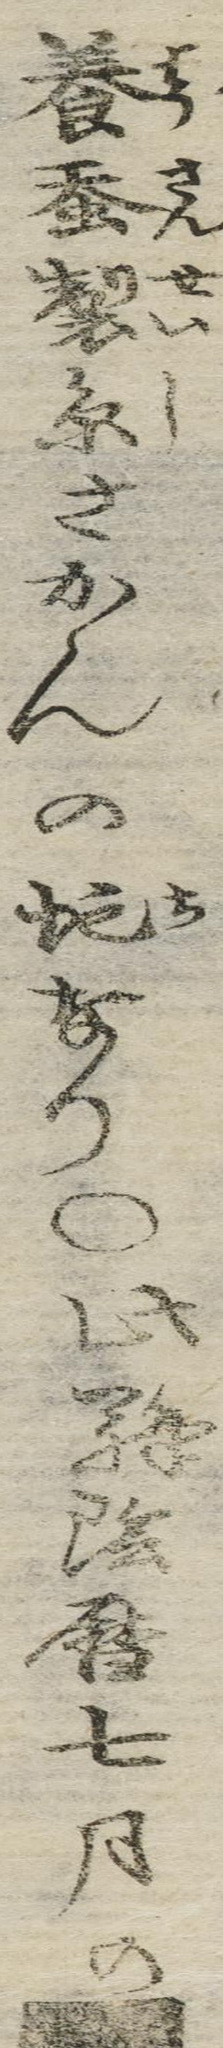養蚕製糸さかんの地なり○此驛陰暦七月の
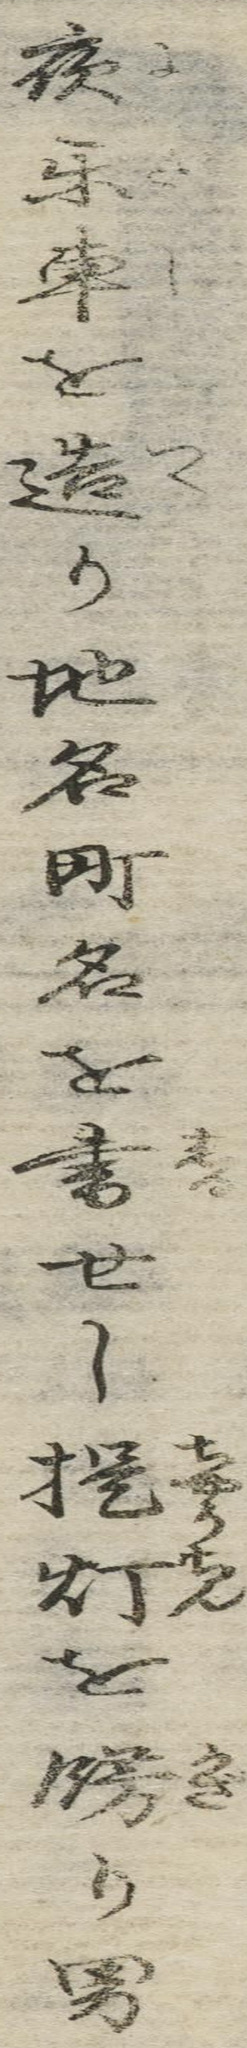夜互車を造り地名町名を書せし提灯を飾り男
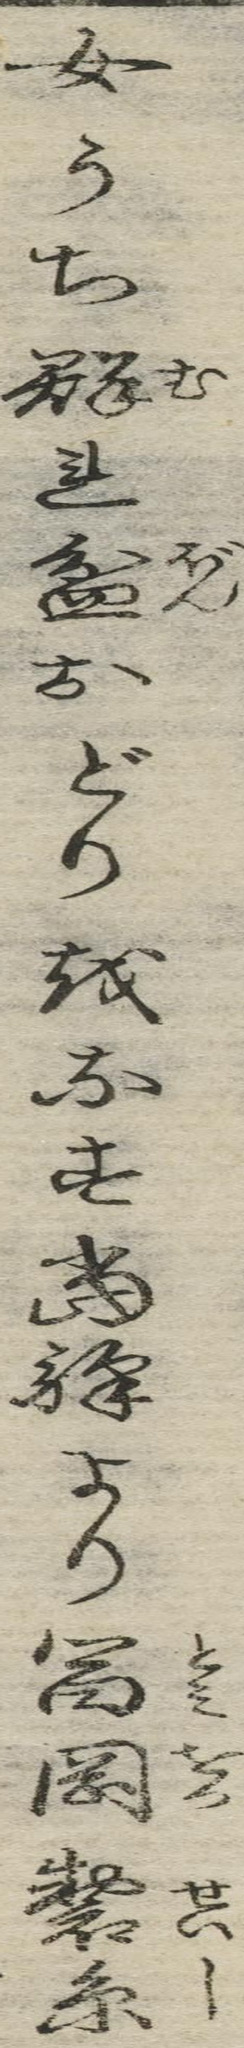女うち群れ盆おどりをなす当驛より富岡製糸
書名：上州伊香保鑛泉圖會　全
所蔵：東京大学地震研究所図書室 Earthquake Research Institute Library, The University of Tokyo, JAPAN
